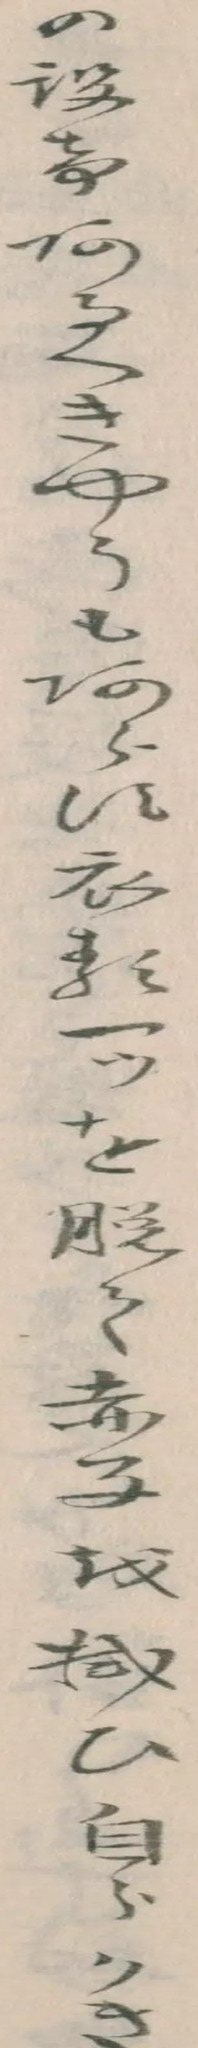の設けあるへきやうもあらす衣類一ツを脱て赤子を拭ひ自らかき
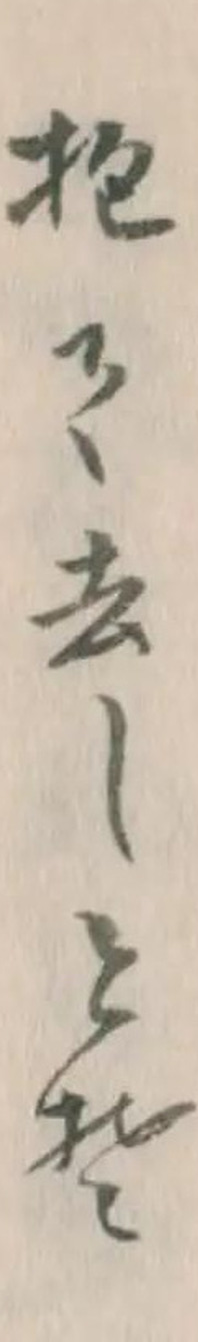抱て去しとそ
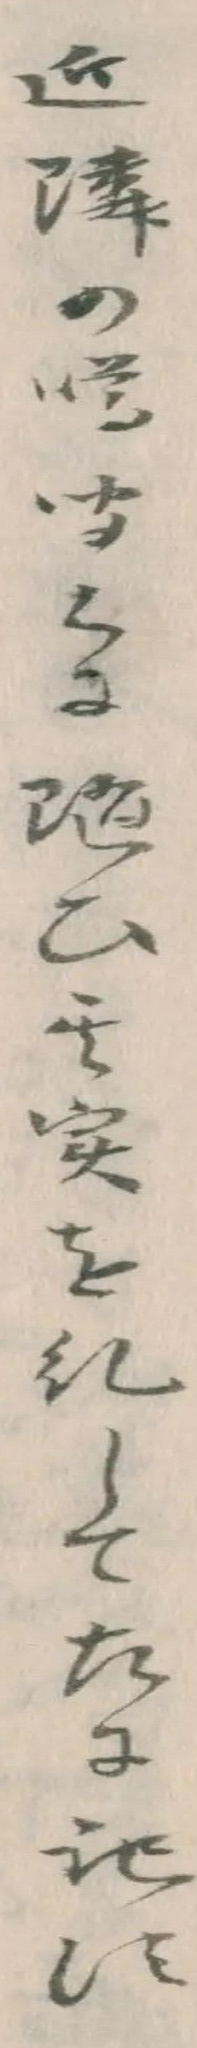近隣の噂聞くに随ひ其実を糺して左に記す
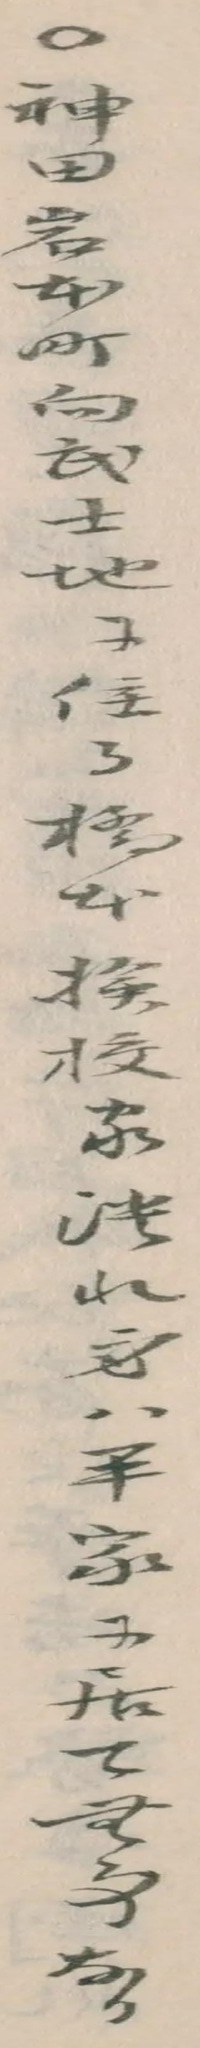〇神田岩本町向武士地に住る橋本検校家潰れ身は平家に居て無事なり
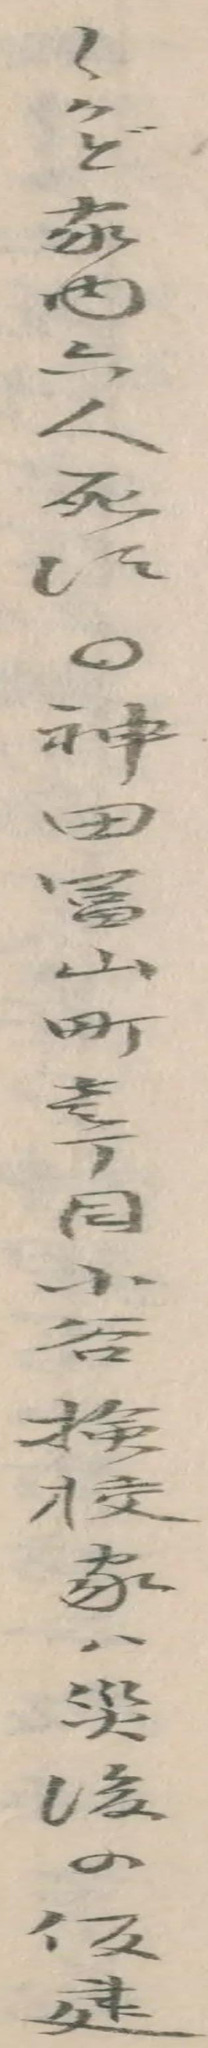しかど家内六人死す〇神田冨山町壱丁目小谷検校家は災後の仮建

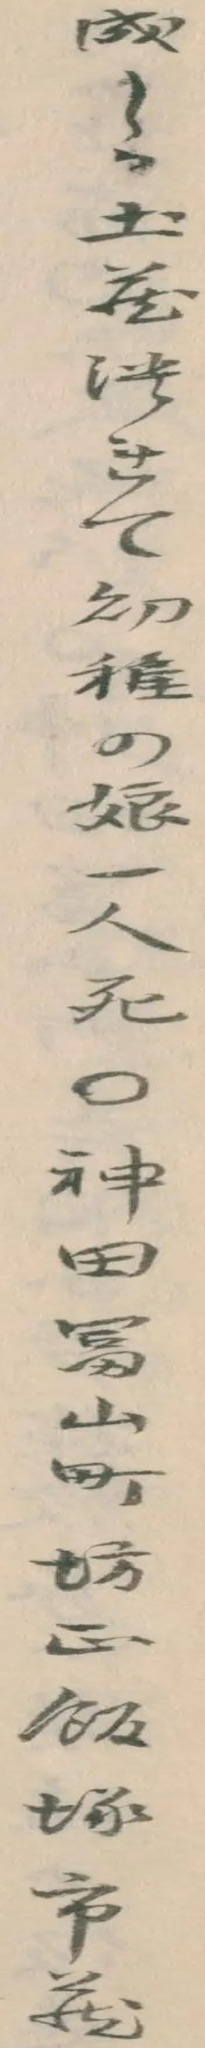成しか土蔵潰れて幼稚の娘一人死〇神田冨山町坊正飯塚市蔵
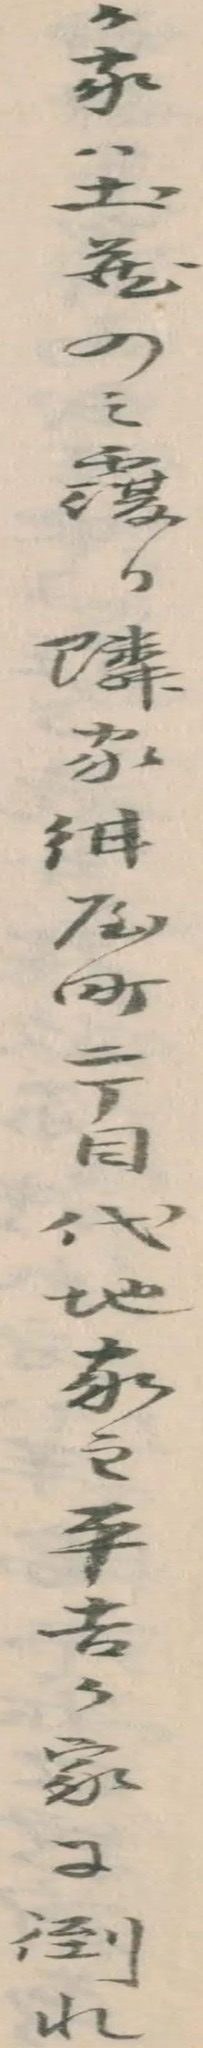か家は土蔵のみ覆り隣家紺屋町二丁目代地家主平吉か家に倒れ
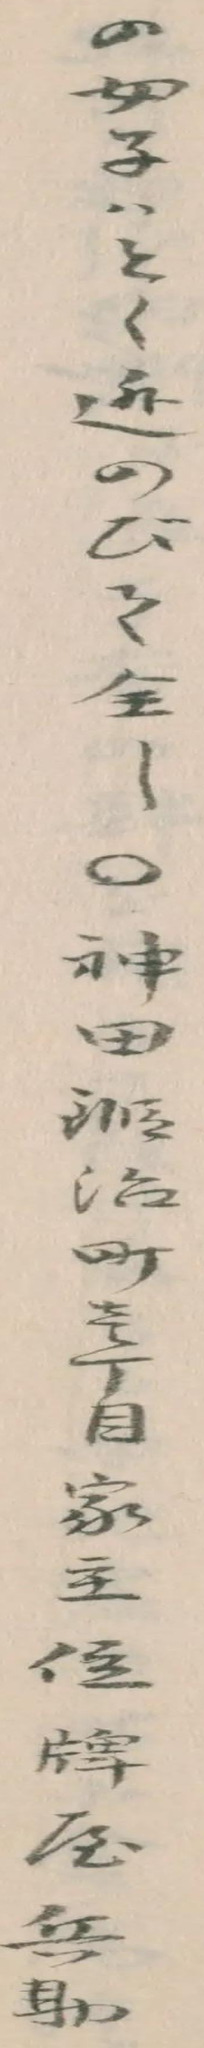の女子はとく逃のびて全し〇神田鍛冶町壱丁目家主位牌屋兵助
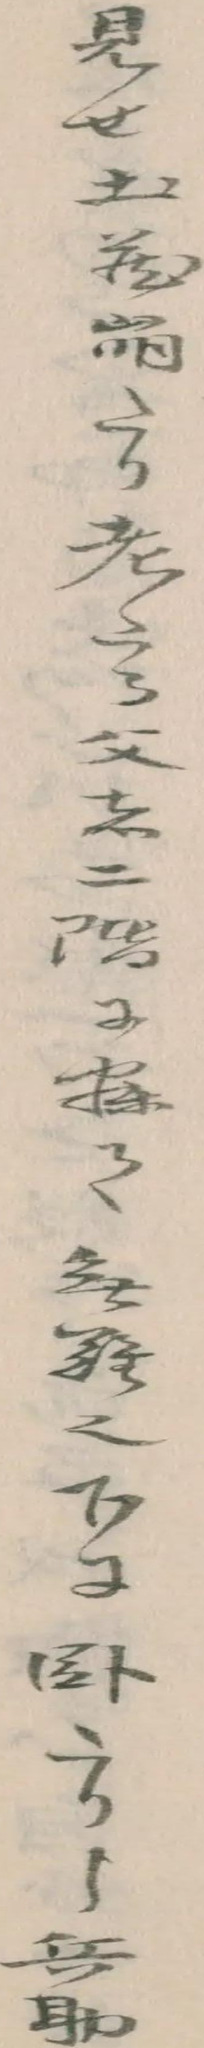見せ土蔵崩たり老たる父は二階に寐て無難也下に臥たりし兵助
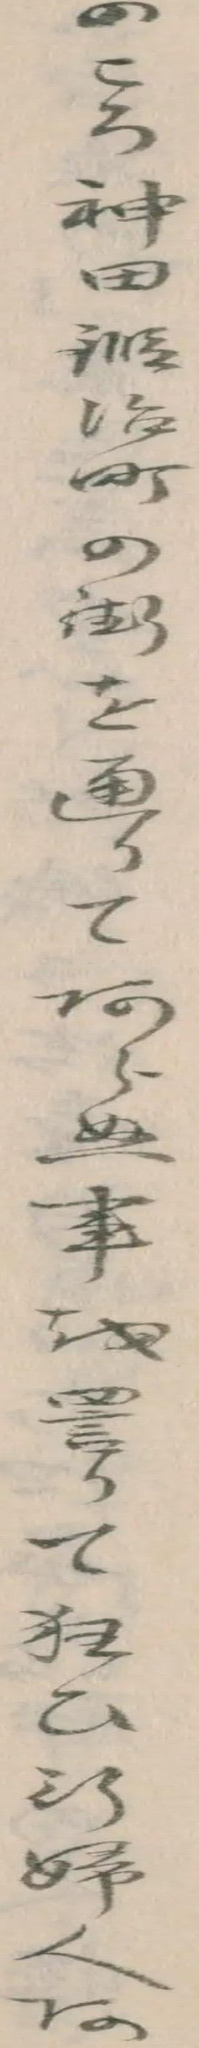のころ神田鍛冶町の街を通りてあらぬ事を詈りて狂ひ行婦人あ
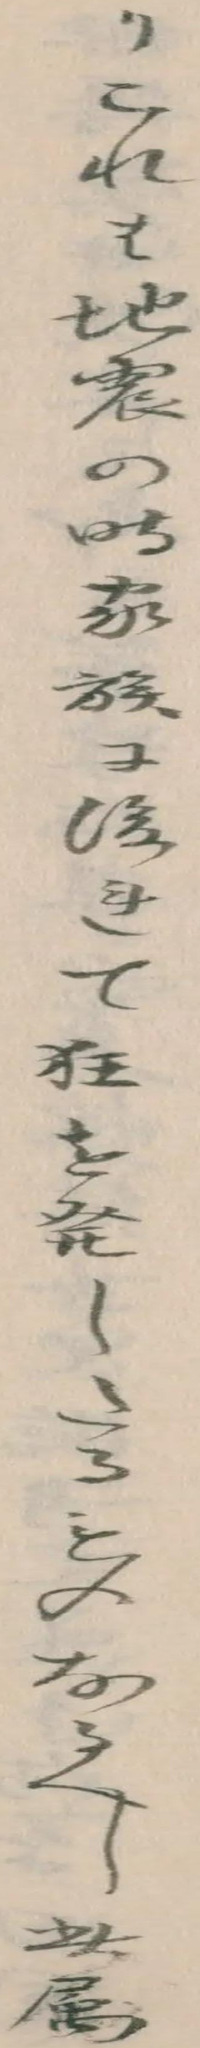りこれは地震の時家族に後れて狂を発したるものなるへし此属
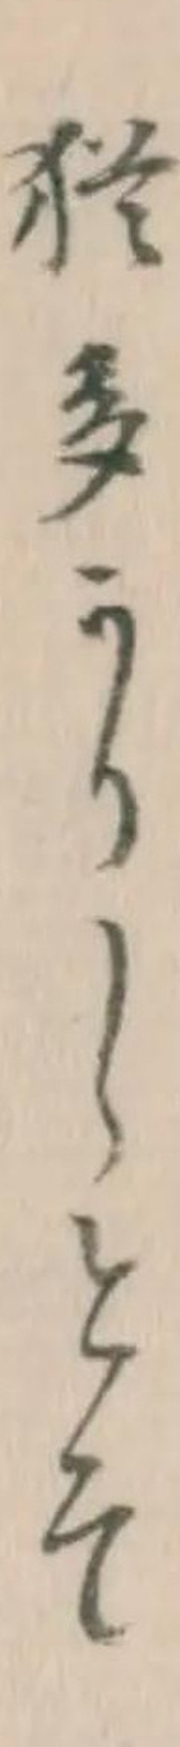猶多かりしとそ
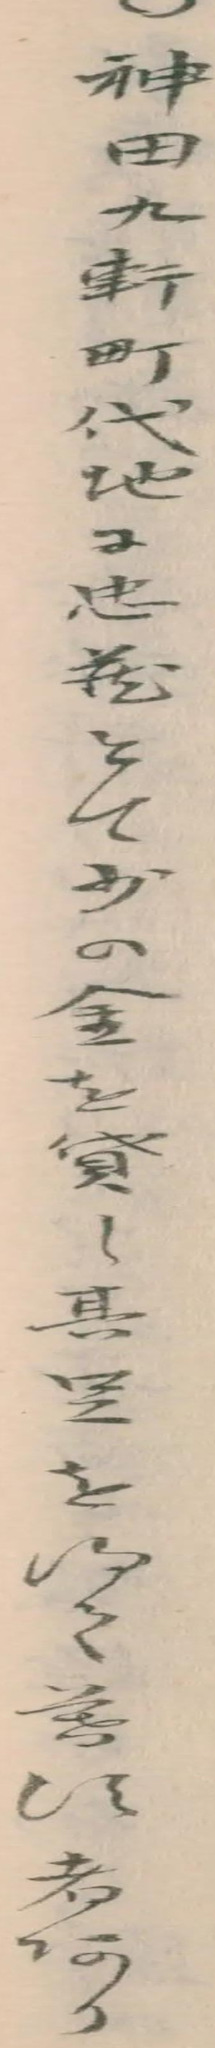〇神田九軒町代地に忠蔵とて少の金を貸し其足を得て暮す者あり
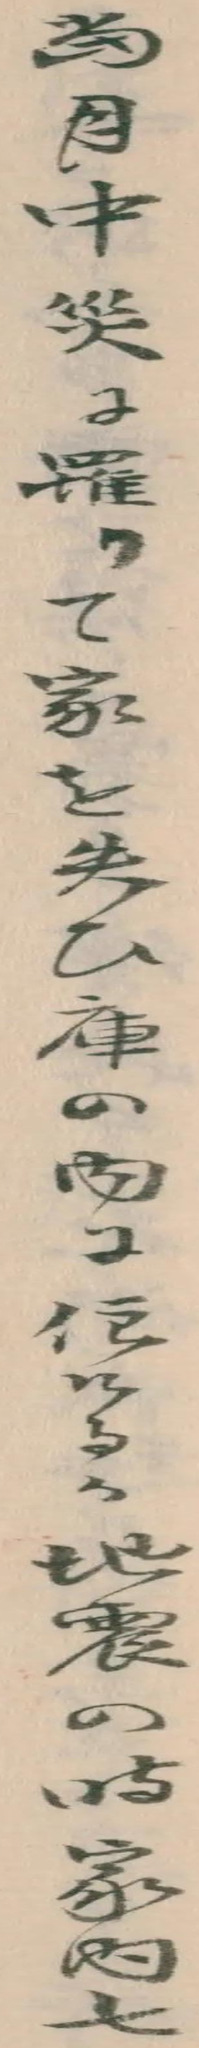当月中災に罹りて家を失ひ庫の内に住けるか地震の時家内七
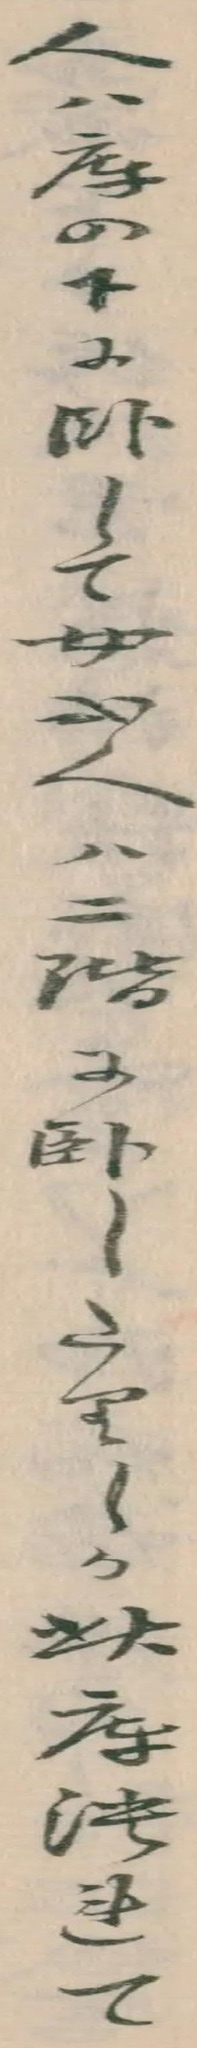人は庫の下に臥して女弐人は二階に臥したりしか此庫潰れて
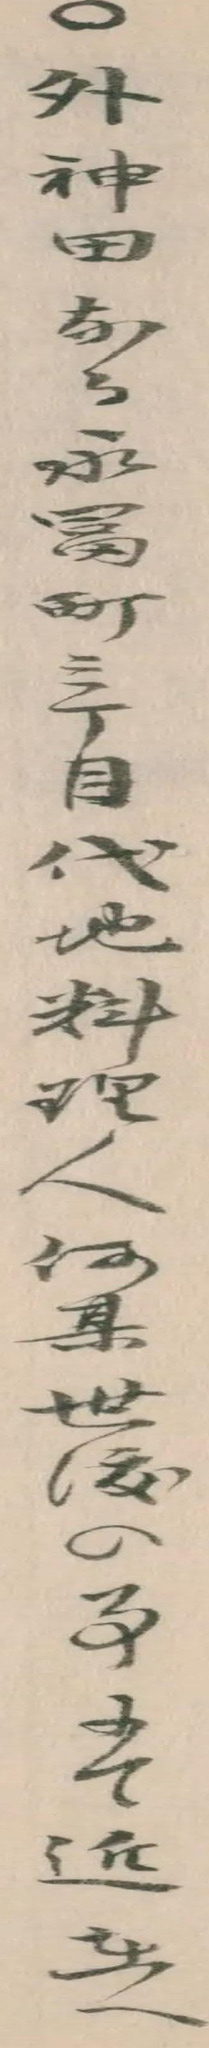〇外神田なる永冨町三丁目代地料理人何某世渡の事にて近在へ
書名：地災撮要. 巻7-9(地震之部)
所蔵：国立国会図書館 National Diet Library, JAPAN
